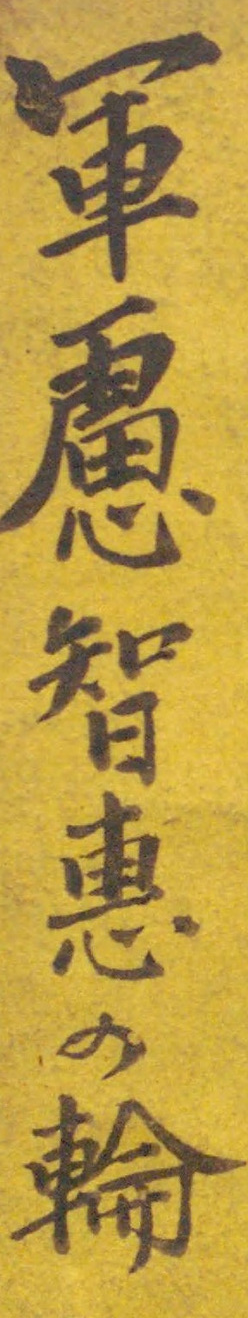軍慮智恵の輪
